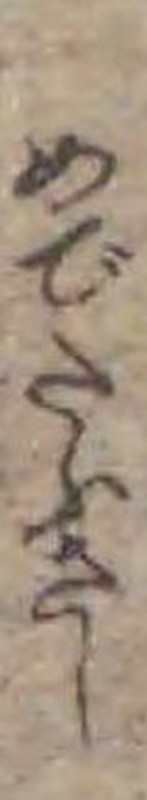めでたふさし
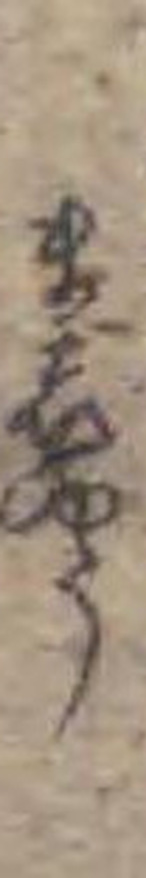まじやう
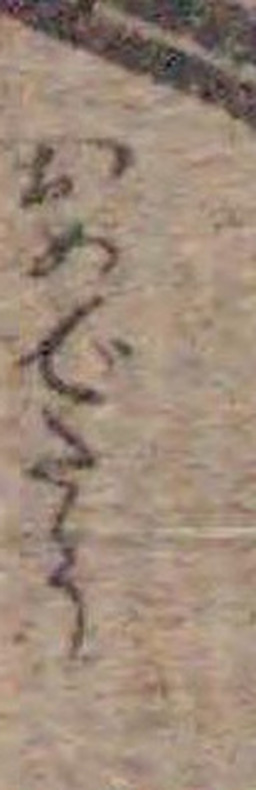おめでたう
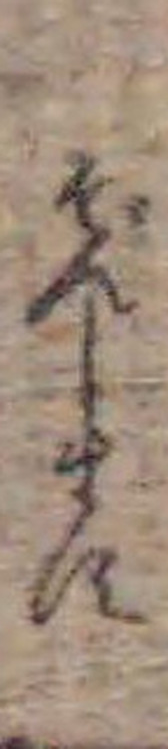ぞんじます
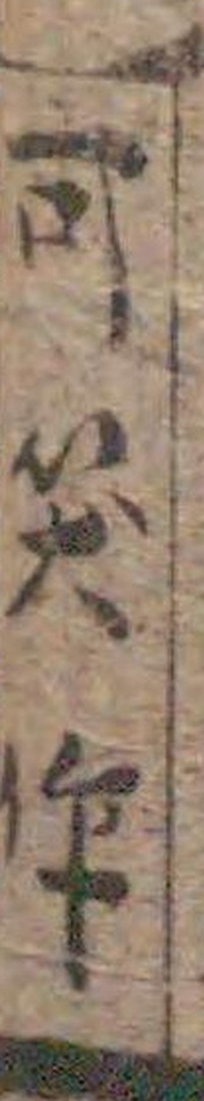可笑作
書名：通風伊勢物語 : 3巻
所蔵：国立国会図書館 National Diet Library, JAPAN
